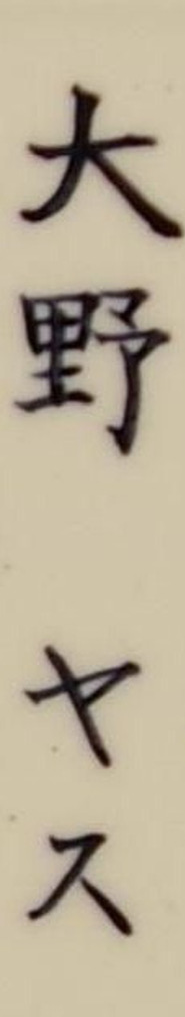大野ヤス
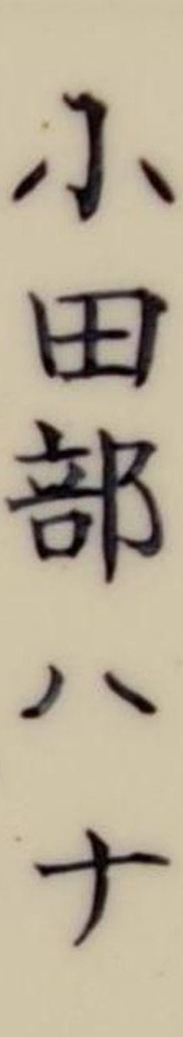小田部ハナ
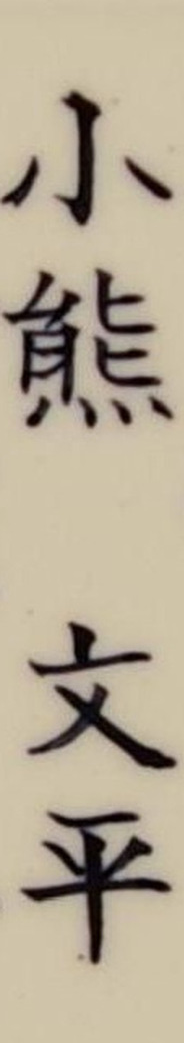小熊文平
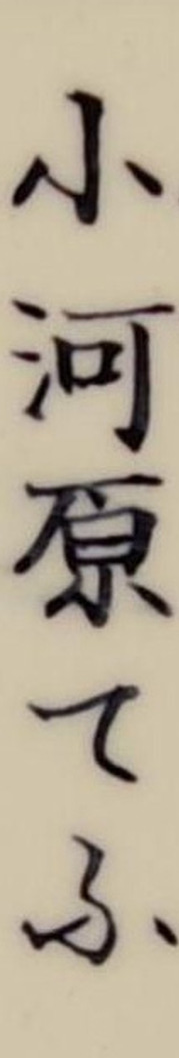小河原てふ
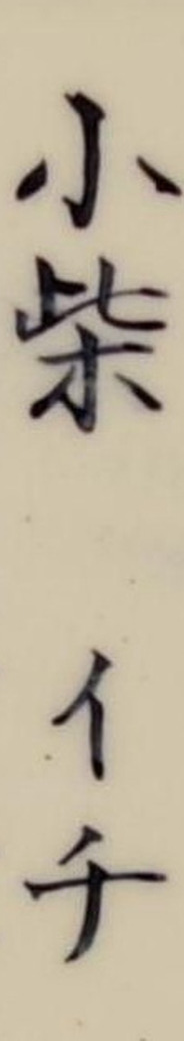小柴イチ
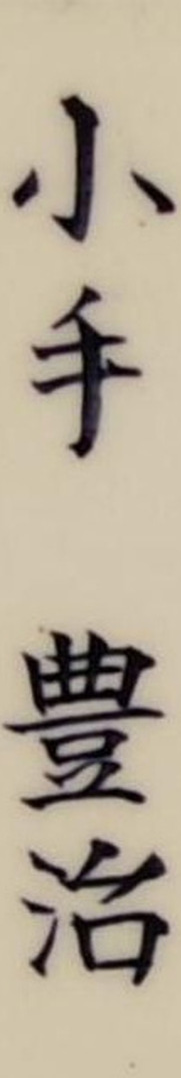小手豊治
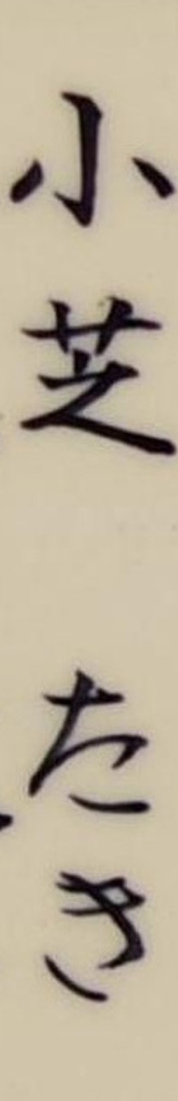小芝たき
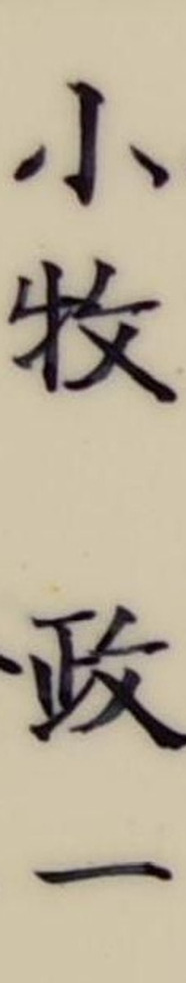小牧政一
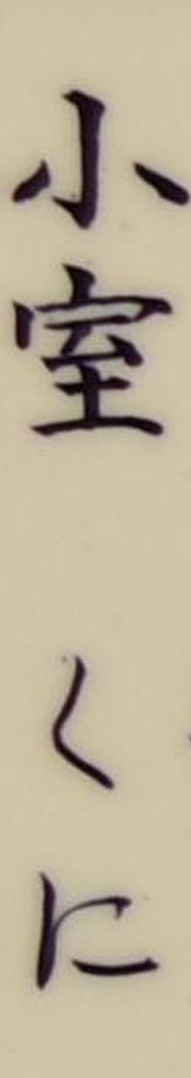小室くに
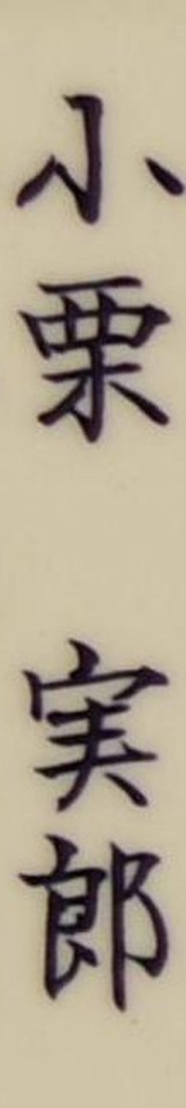小栗実郎
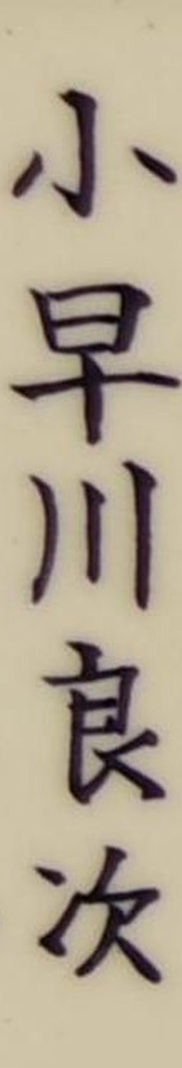小早川良次
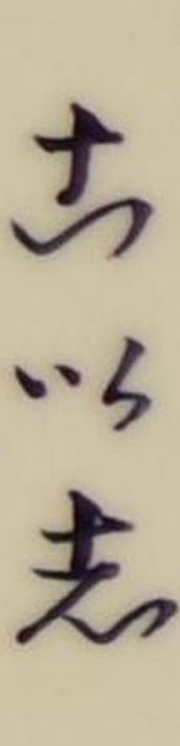こいし

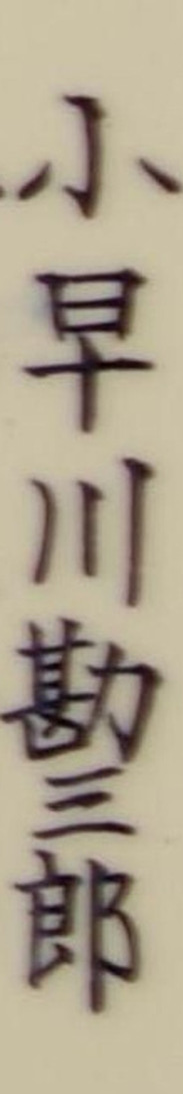小早川勘三郎
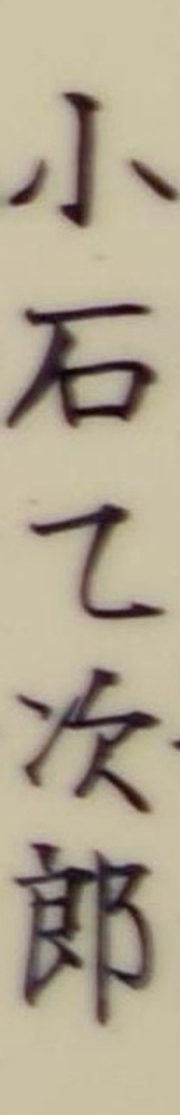小石乙次郎
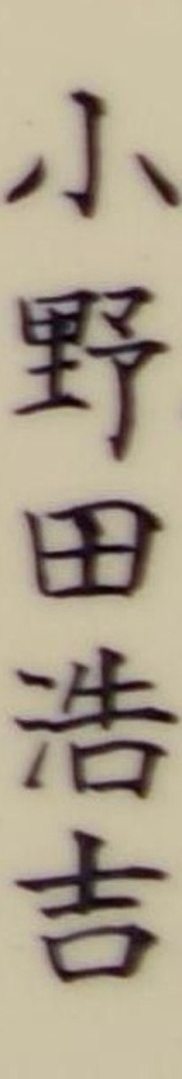小野田浩吉
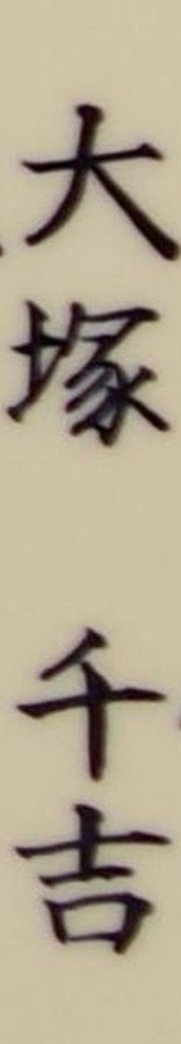大塚千吉
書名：E~L
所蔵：高野山金剛峯寺
